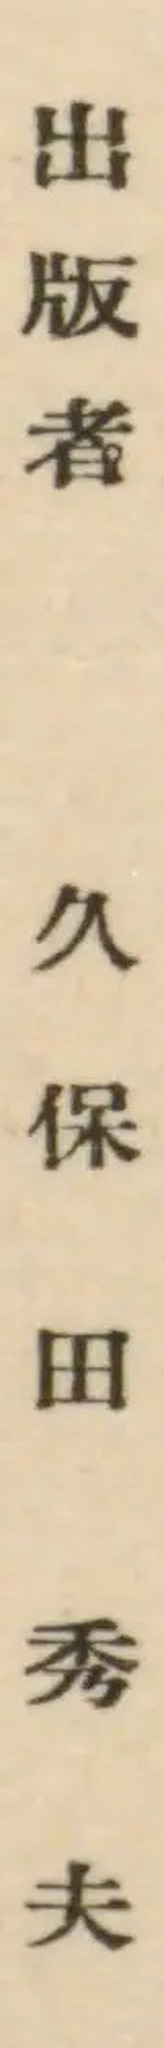出版者久保田秀夫
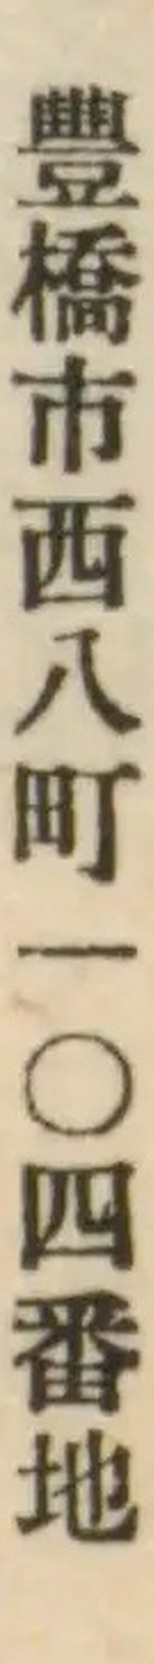豊橋市西八町一〇四番地
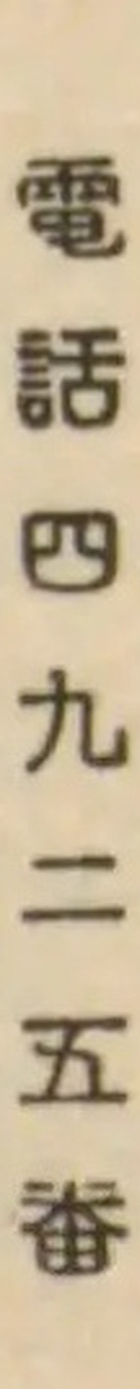電話四九二五番
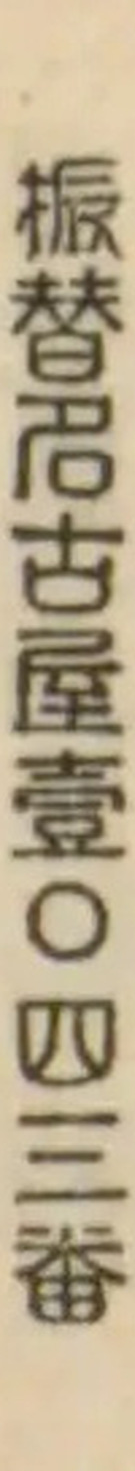振替名古屋壱〇四三番

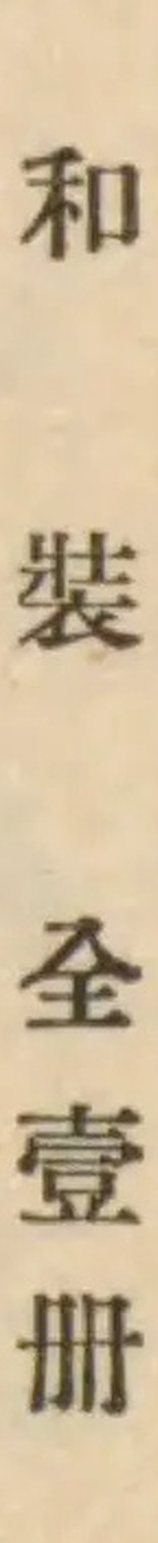和装全壱冊
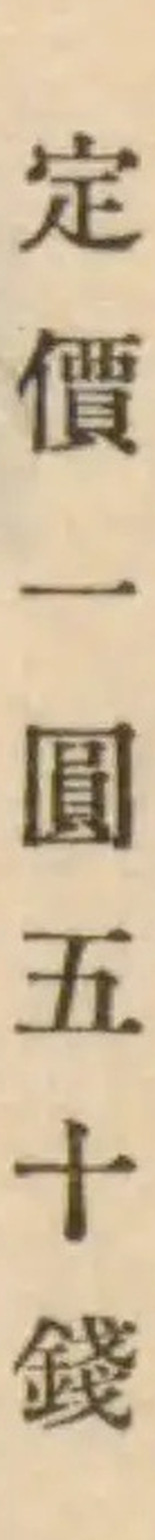定価一円五十銭
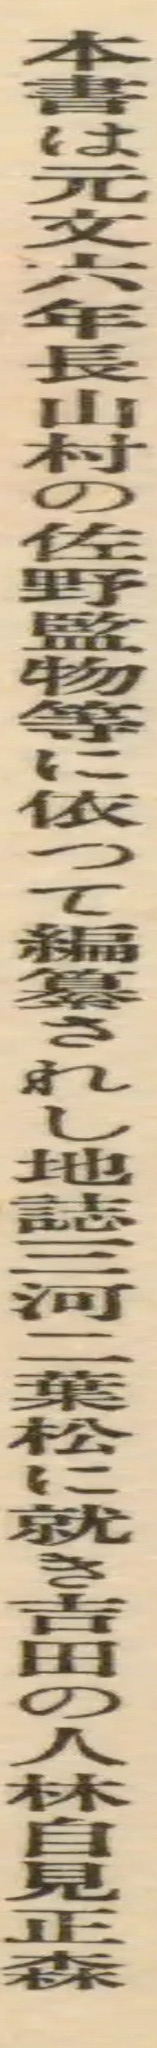本書は元文六年長山村の佐野監物等に依つて編纂されし地誌三河二葉松に就き吉田の人林自見正森
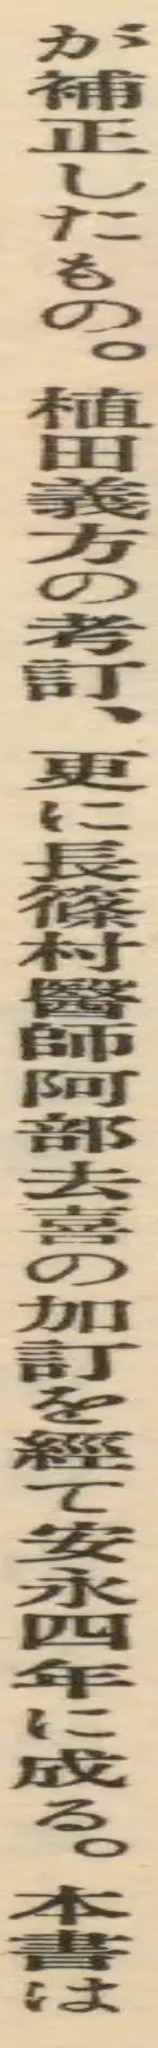が補正したもの。植田義方の考訂、更に長篠村医師阿部去喜の加訂を経て安永四年に成る。本書は
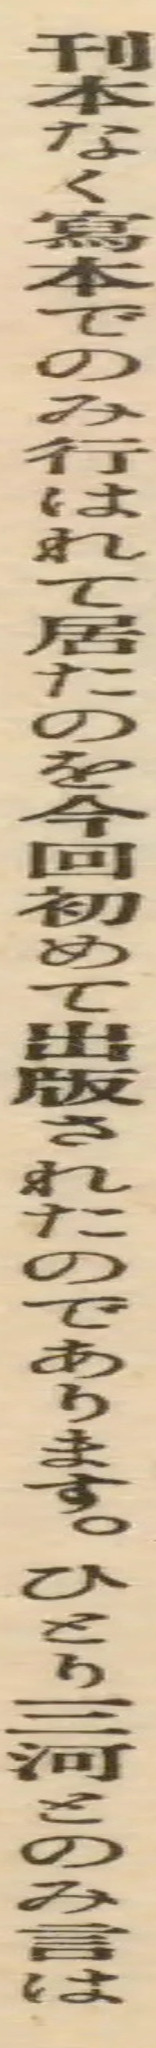刊本なく写本でのみ行はれて居たのを今回初めて出版されたのであります。ひとり三河とのみ言は
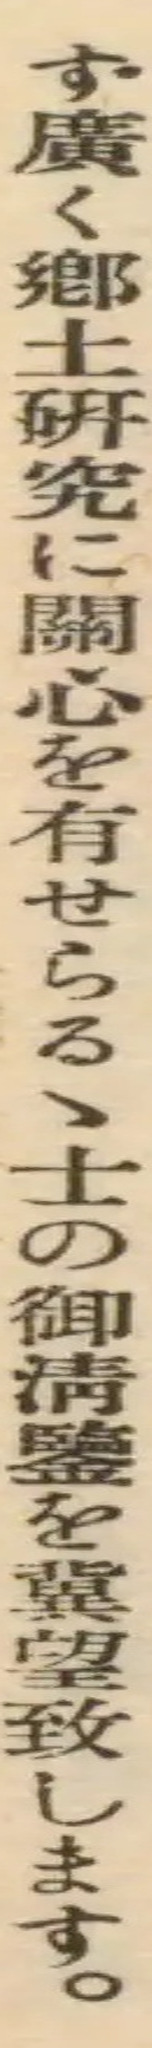ず広く郷土研究に関心を有せらるゝ士の御静鑿を冀望致します。
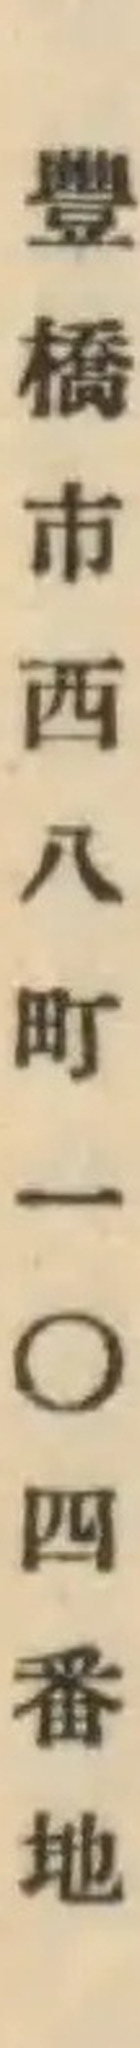豊橋市西八町一〇四番地
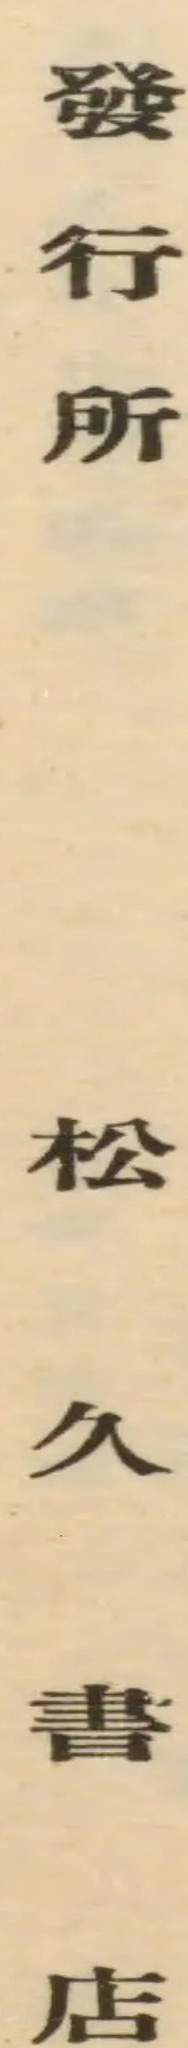発行所松久書店
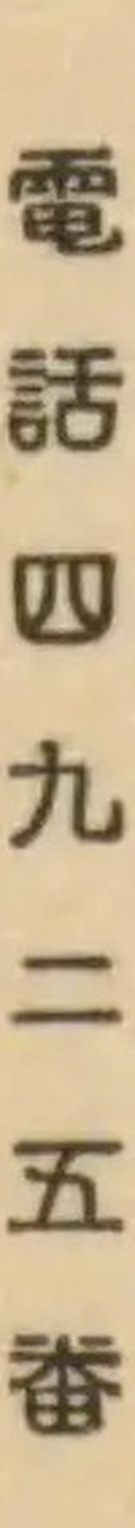電話四九二五番
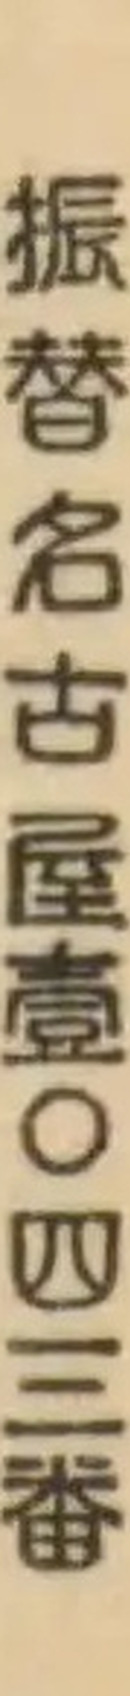振替名古屋壱〇四三番
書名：東三河之古城
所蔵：国立国会図書館 National Diet Library, JAPAN
